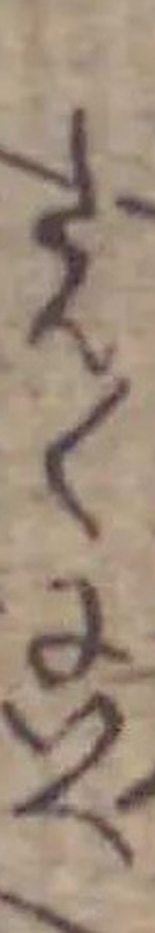たん〳〵いへ
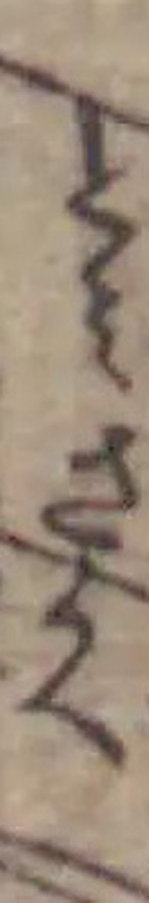とみさかへ
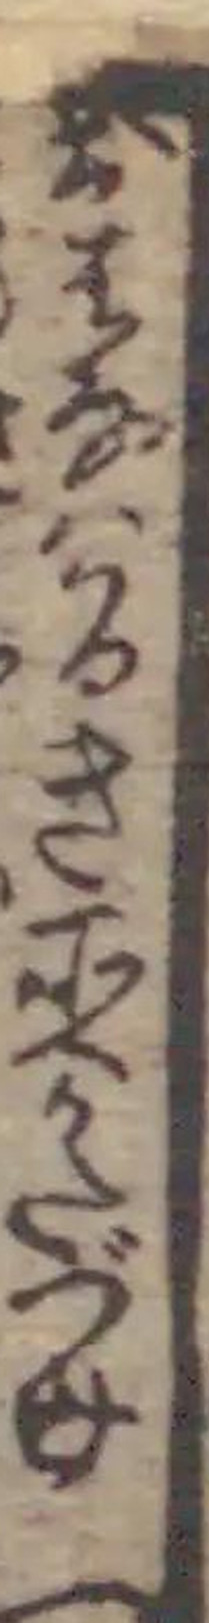おはなはかるき所へかたづけ
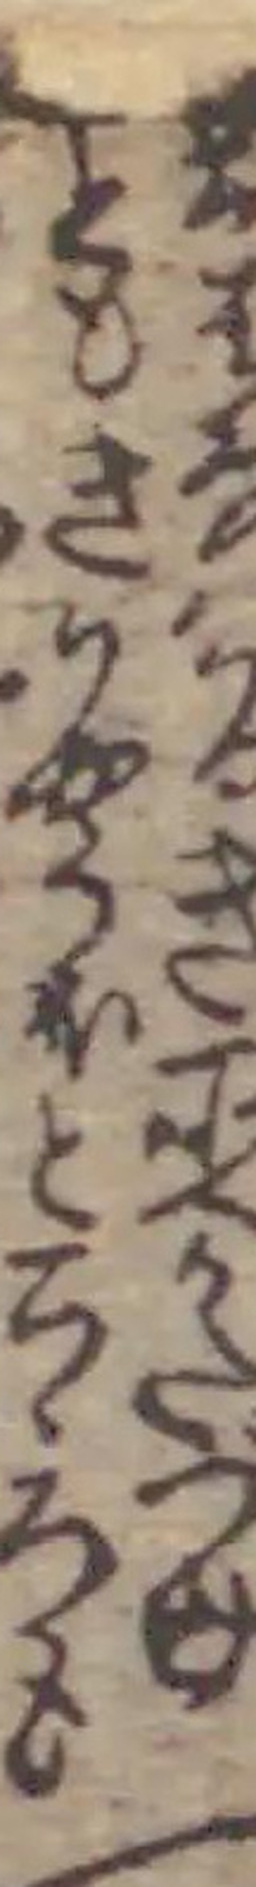ともきりやうほとこゝろも
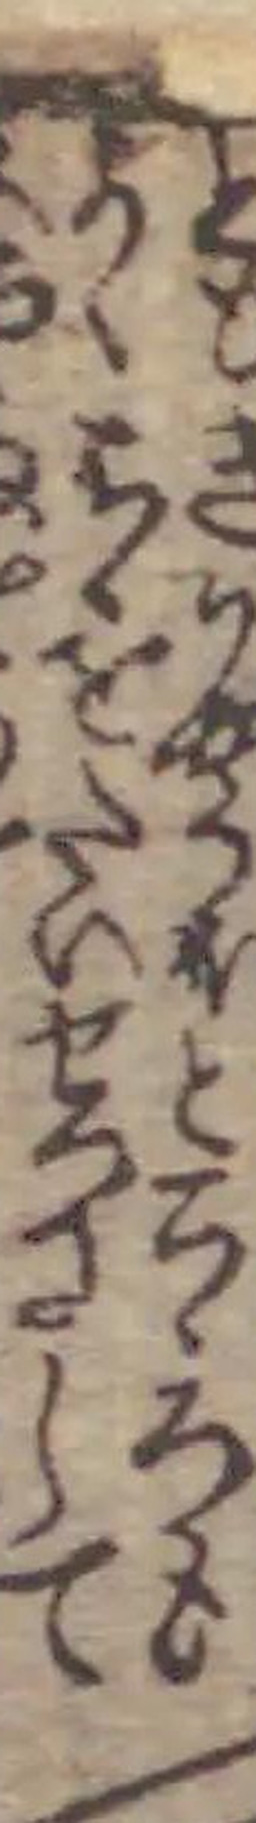よくはゝをたいせつにして
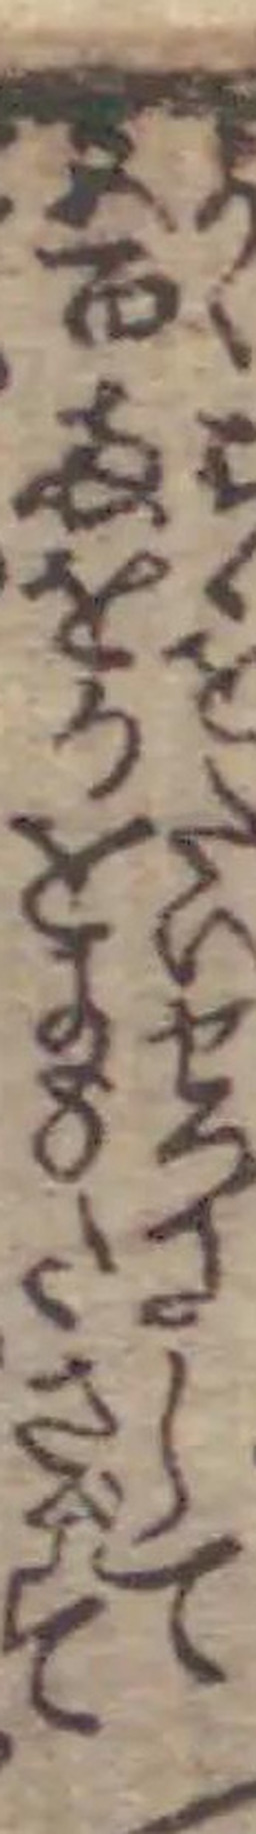五百両をかをにもたさす
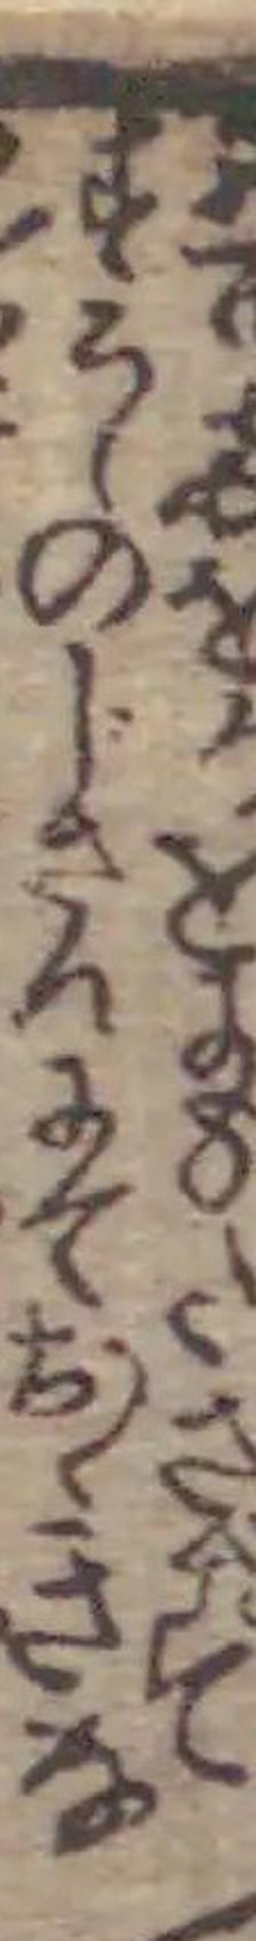すこしのじさんにておゝきな
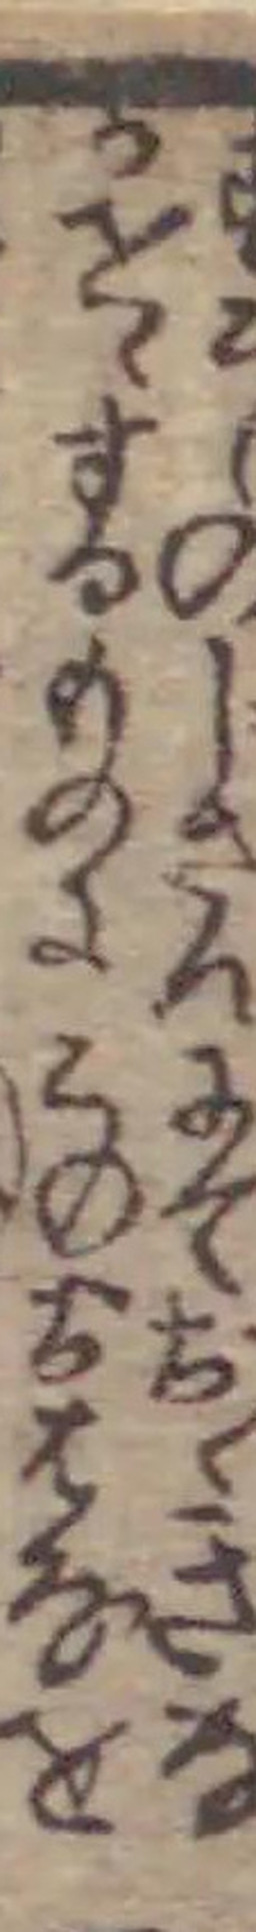かをゝするものにこのおはなを
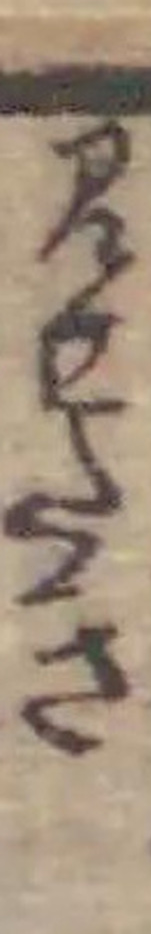みせたき
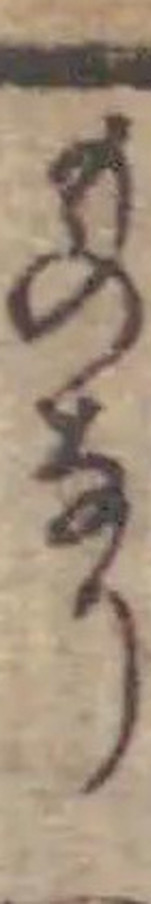ものなり

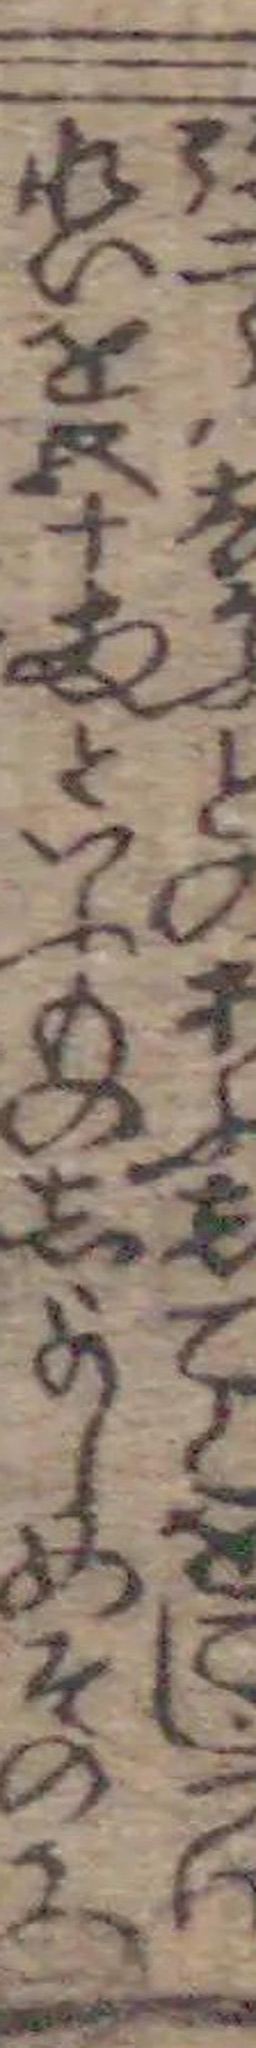れいを五十両といふものしよしめそのかつ
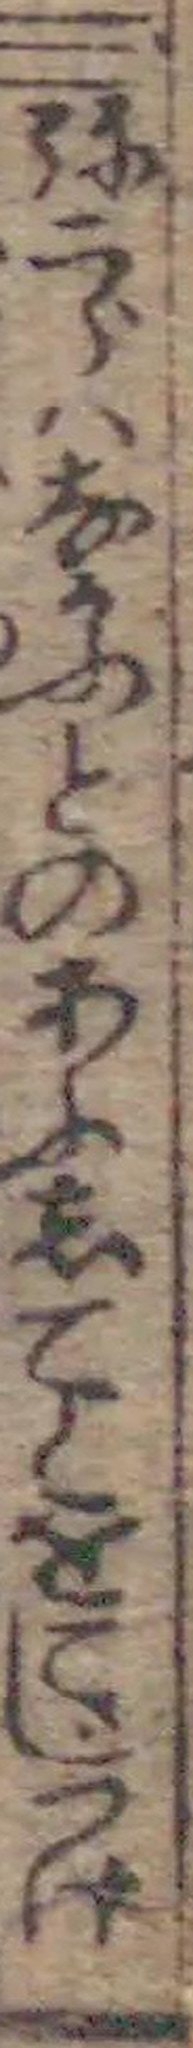弥二郎はなかふとのあふしことをこじつけ
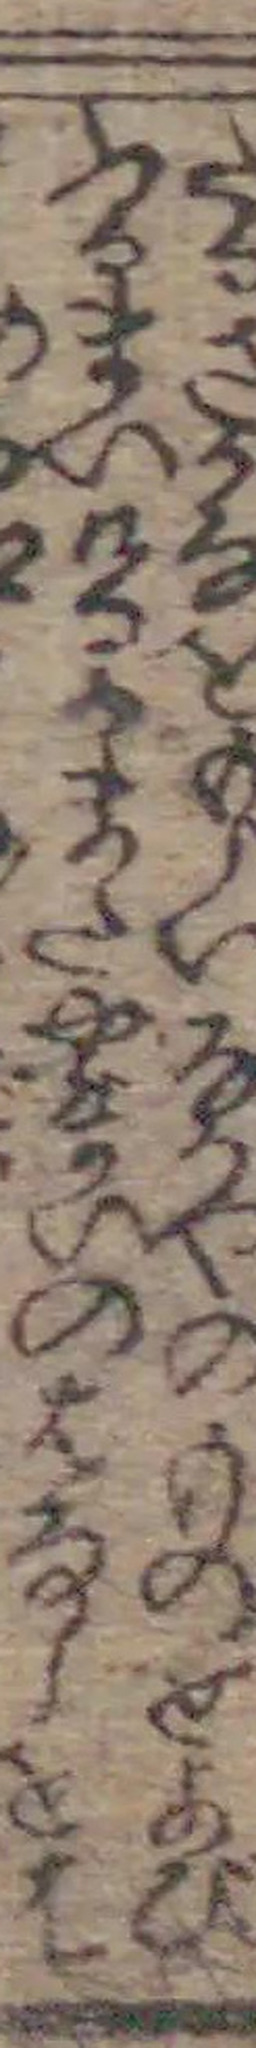ふるまいけるかまたやまいのはなしをは
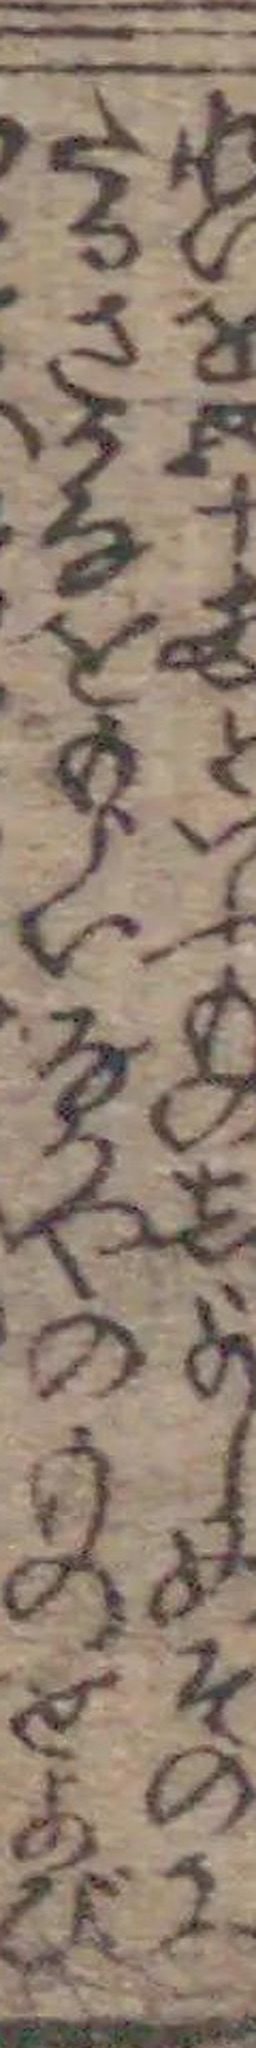たるさかなをもらいなかやのものをよび
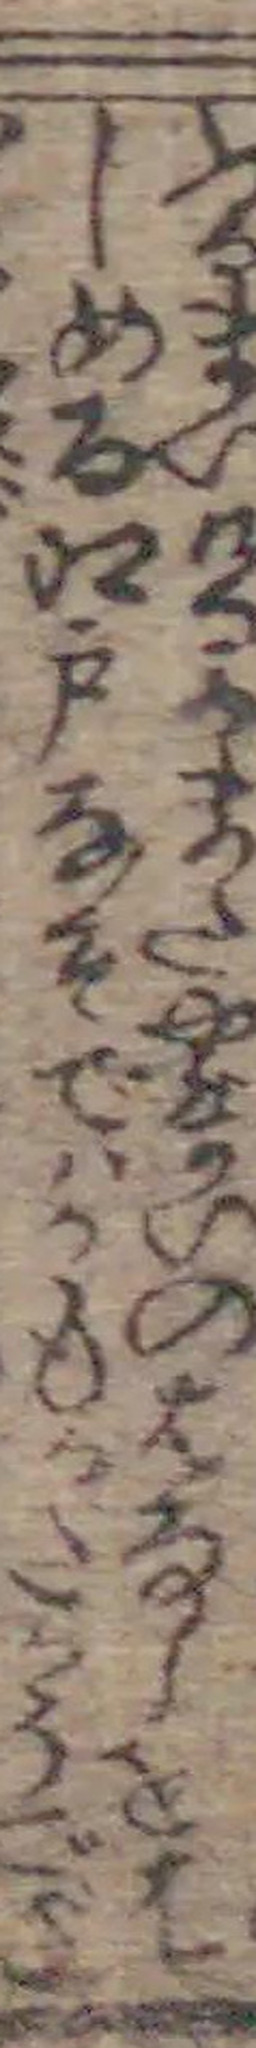しめる江戸なそではかもかたかうござ
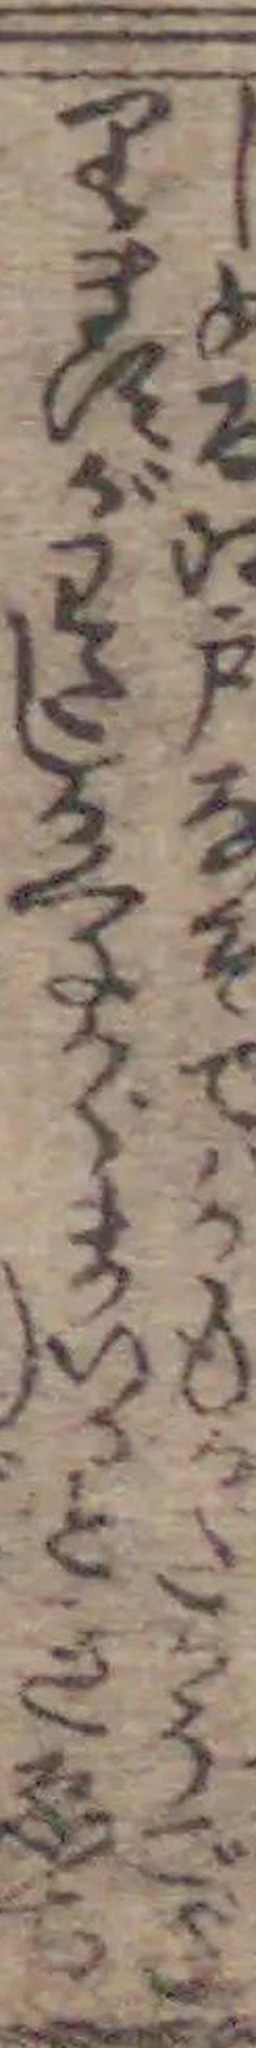りますがわたしかくにからまいるときゑち
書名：虚言弥二郎傾城誠 3巻
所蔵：国立国会図書館 National Diet Library, JAPAN
